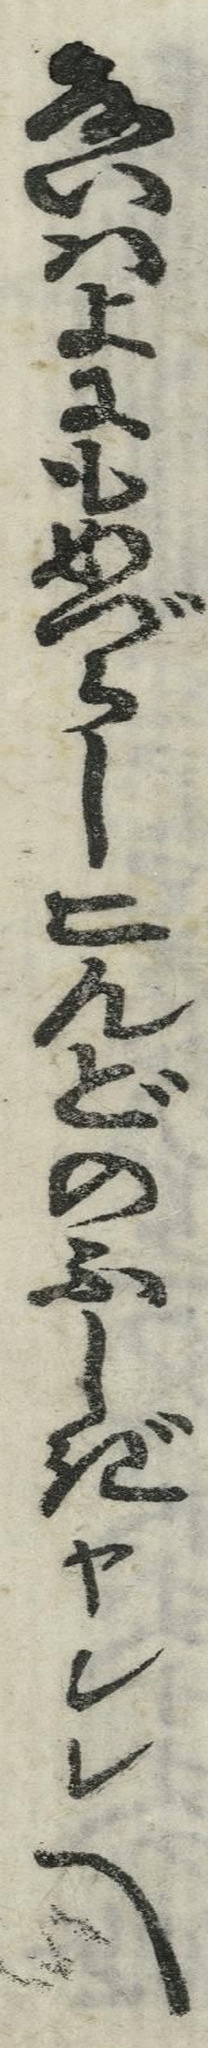ないはよにもめづらしこんどのふしぎヤレレ〳〵
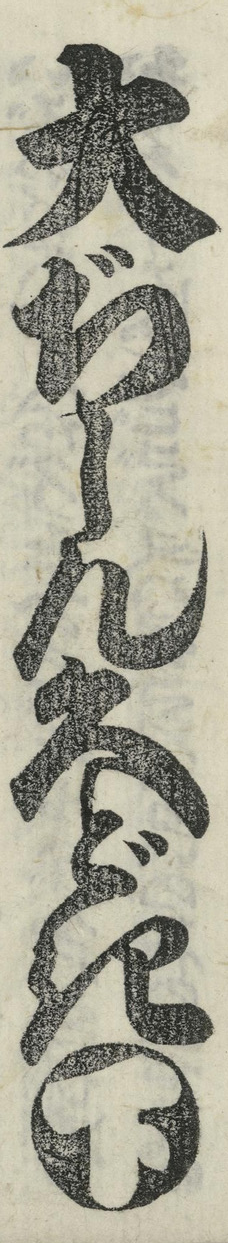大ぢしんくどき下
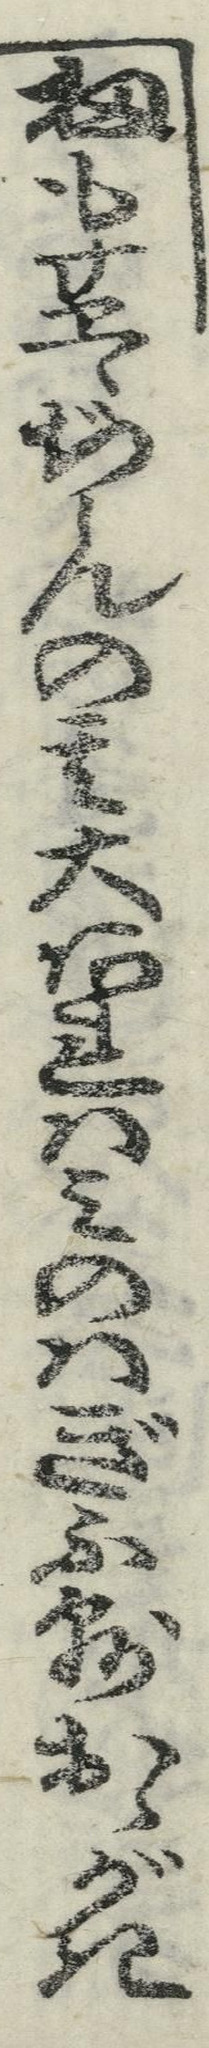〽扨もサヱヽぢしんの其大あれはみのはぎふ県おゝがき
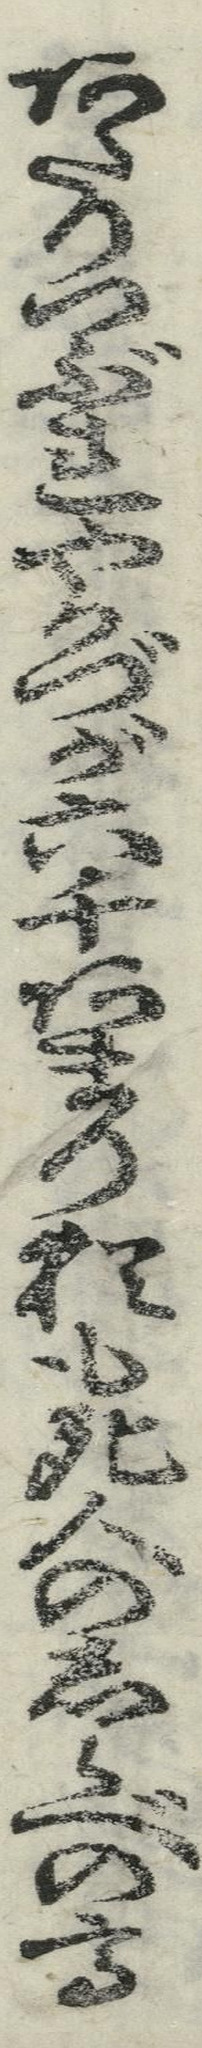あたりつぶれやかづが六千あまり猶も死人のしらべの高
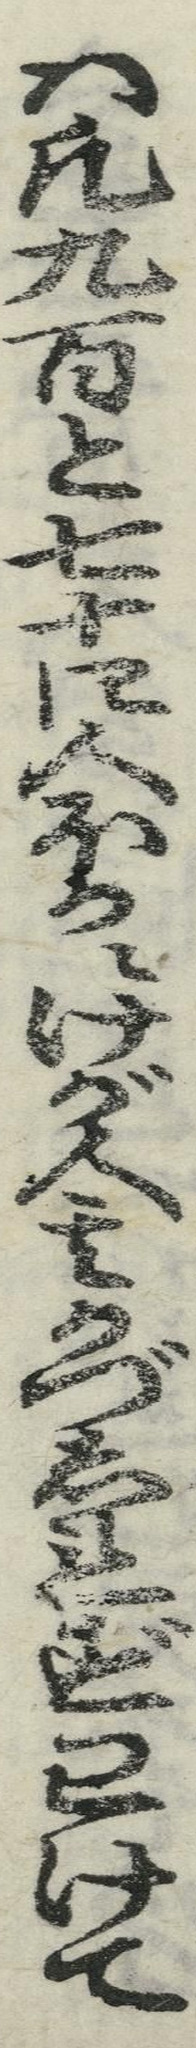は凡九百と七十四人ほかにけが人其かづしれずわけて
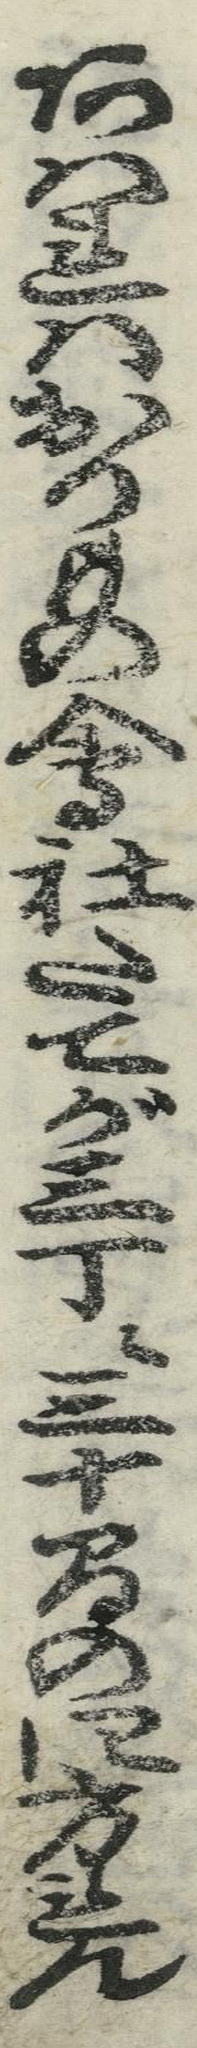あはれはおりもの会社たてが三丁に三十間の四方れん
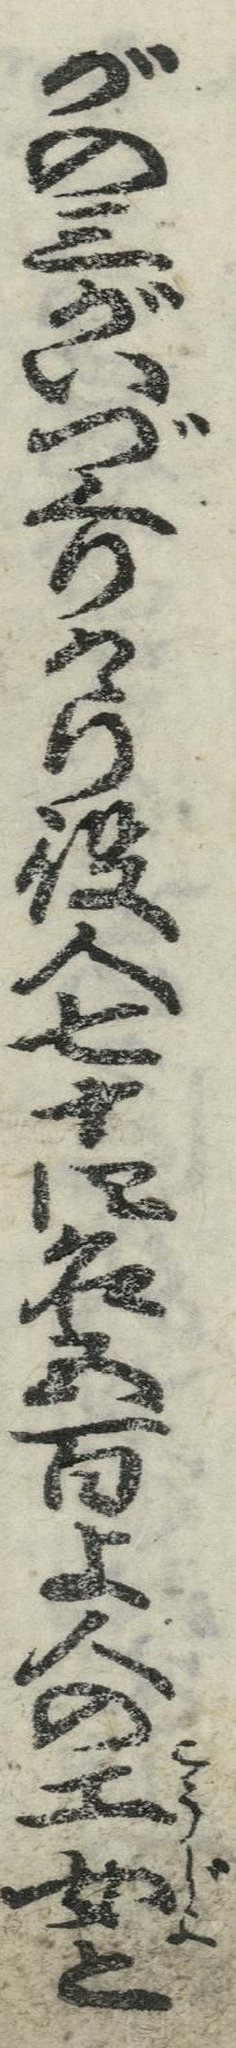がの三がいづくりけり役人七十四名五百よ人の工女と
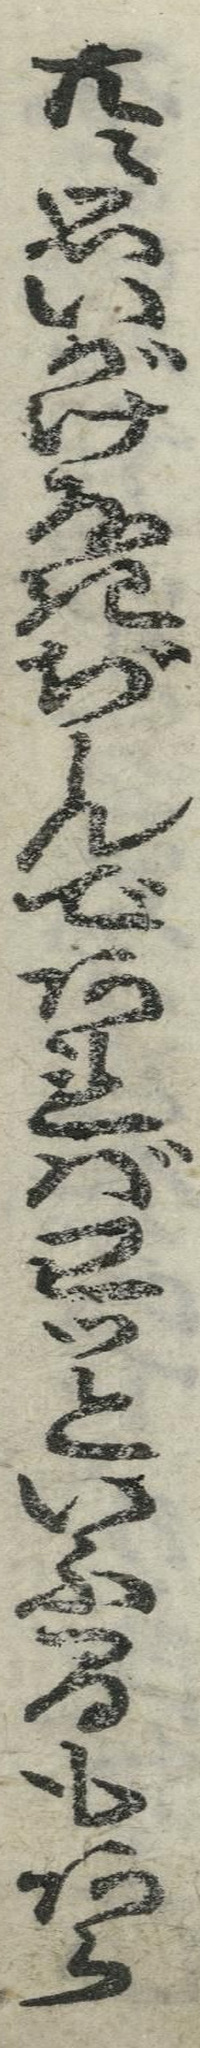共に思いがけなきぢしんであればわつといふ間もあら

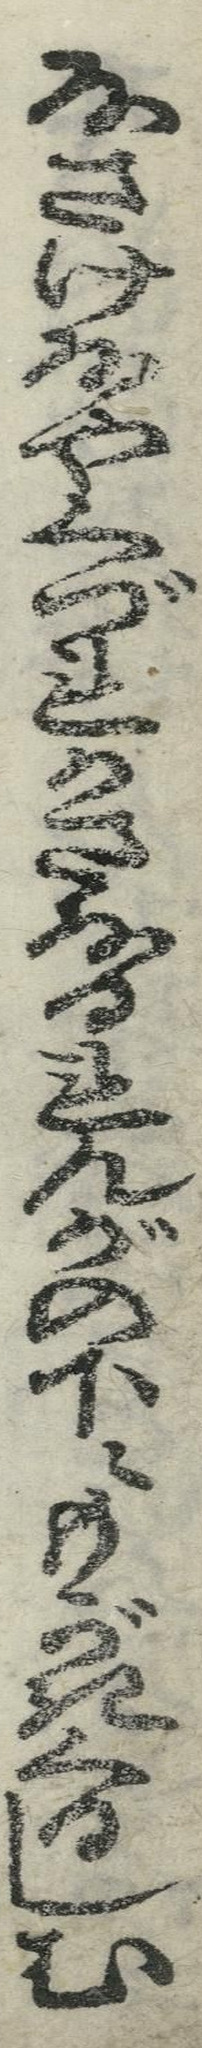なさけなやくづれかさなるれんがの下にもがきくるしむ
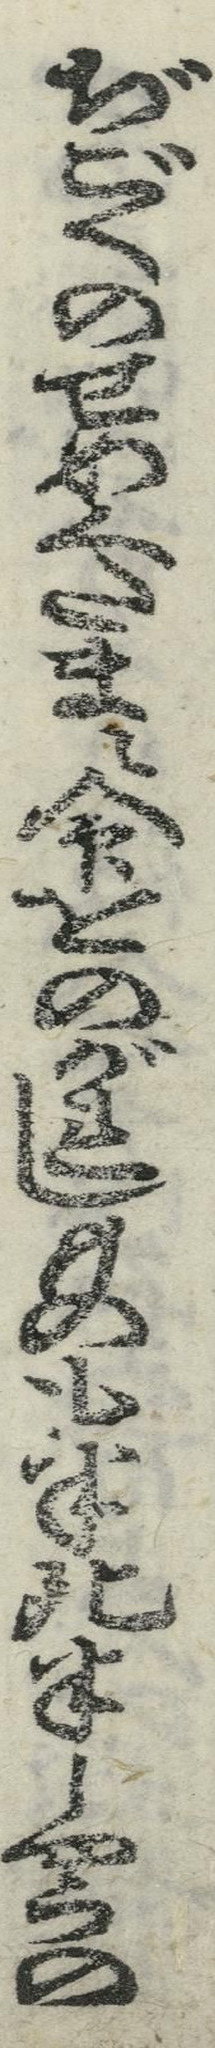ぢごくのせめくたまに命をのがれしものも半死半しやうの
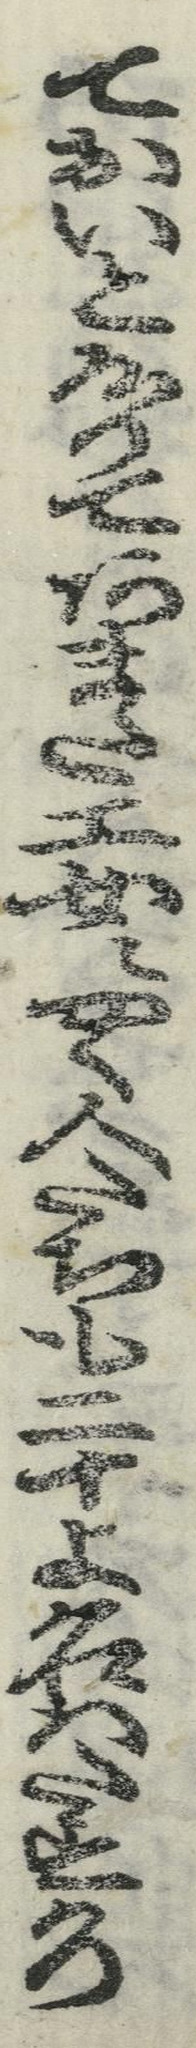ておいとなりてあまた工女にやく人たちも二十よ名はたすかり
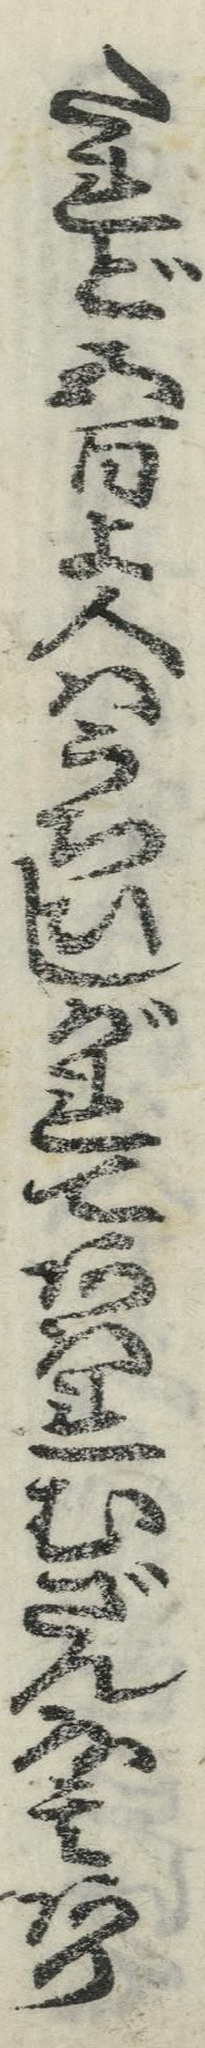たれど五百よ人はうちひしがれてあはれむざんな其あり
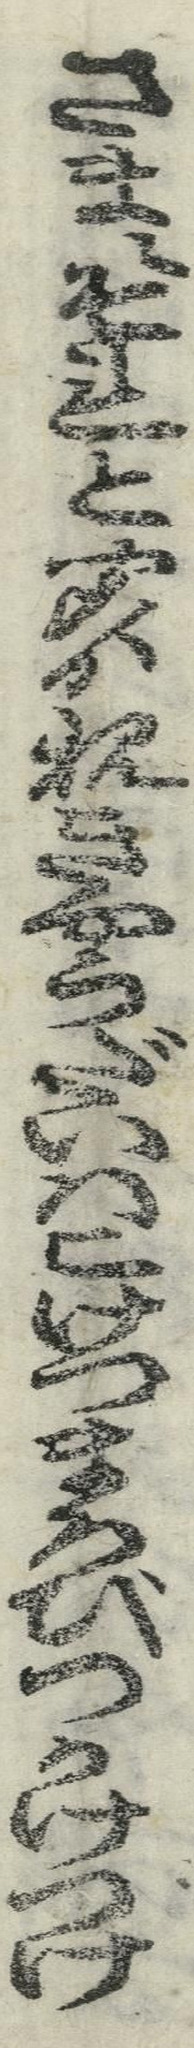さまにそれと聞ゟ親きやうだいはこけつまろびつかけつけ
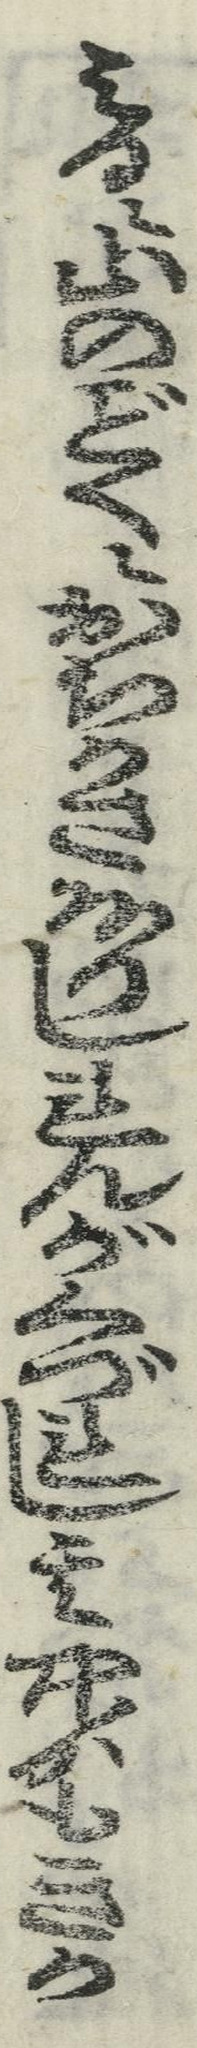みるに山のごとくにおちかさなりしれんがくづれし其中ゟもきか
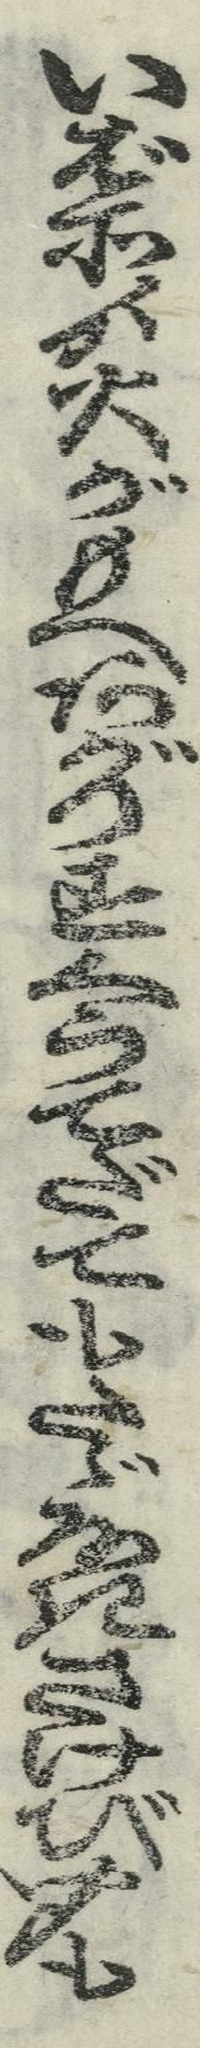いば所ゟ火がもへあがりすくうてだてもたゞなきさけび聞も
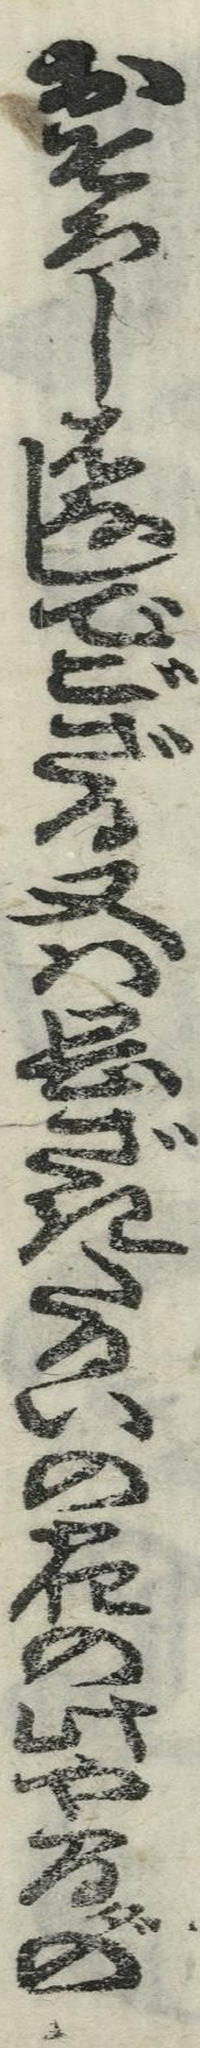おそろしはなしでござる又は岡ざきたるいの宿の此や間ダの
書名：十二ヶ国大地しんくどき
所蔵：東京大学地震研究所図書室 Earthquake Research Institute Library, The University of Tokyo, JAPAN
